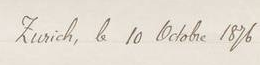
Zurich, le 10 Octobre 1876
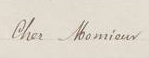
Cher Monsieur
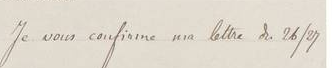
Je vous confirme ma lettre du 26/27
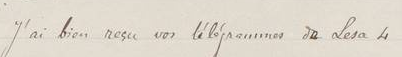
J'ai bien reçu vos télégrammes de Lesa4
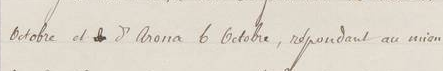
Octobre et de d'Arona6 Octobre, répondant au mien
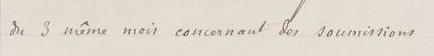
du 3 même mois concernant des soumissions
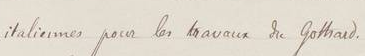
italiennes pour les travaux du Gothard.
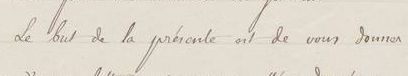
Le but de la présente est de vous donner
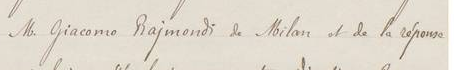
M. Giacomo Rajmondi de Milan et de la réponse
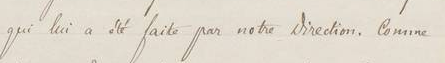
qui lui a été faite par notre Direction. Comme
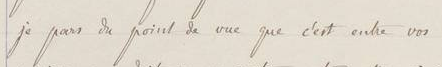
je pars du point de vue que c'est entre vos
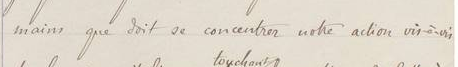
mains que doit se concentrer notre action vis-à-vis
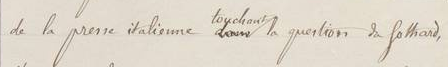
de la presse italiennedanstouchant la question du Gothard,
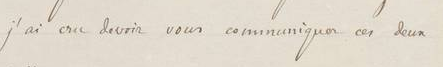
j'ai cru devoir vous communiquer ces deux
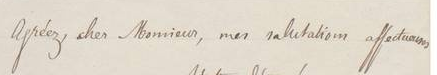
Agréez, cher Monsieur, mes salutations affectueuses
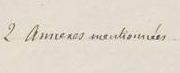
2 Annexes mentionnées.
